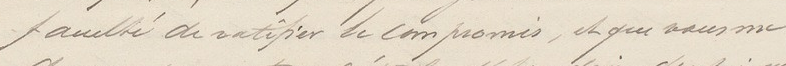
faculté de ratifier le compromis, et que vous me
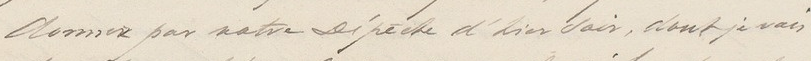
donnez par votre dépêche d'hier soir, dont je vais
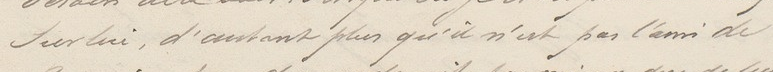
sur lui, d'autant plus qu'il n'est pas l'ami de
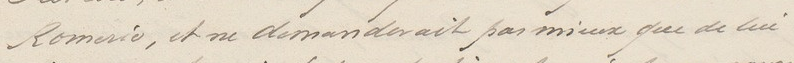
Romerio, et ne demanderait pas mieux que de lui
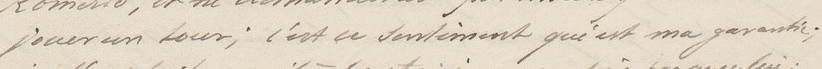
jouer un tour; c'est ce sentiment qui est ma garantie;
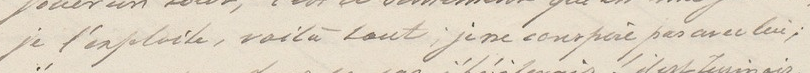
je l'exploite, voilà tout; je ne conspire pas avec lui;
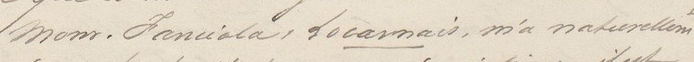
Mons. Fanciola, Locarnais, m'a naturellemt
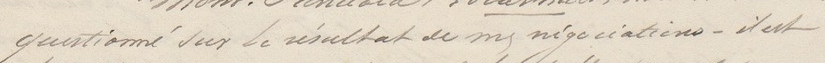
questionné sur le résultat de mes négociations – il est
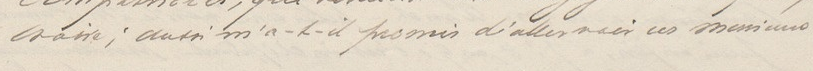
croire; aussi m'a-t-il promis d'aller voir ces Messieurs
